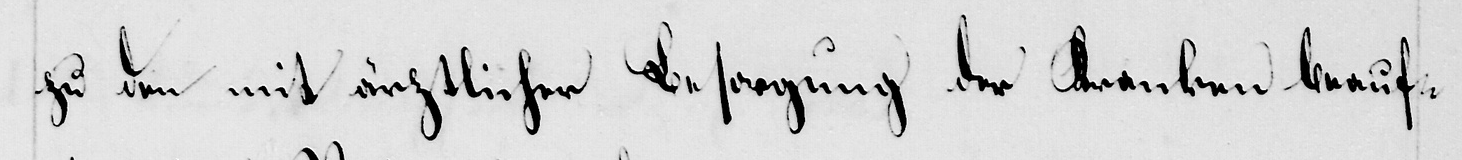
zu den mit ärztlicher Besorgung der Kranken beauf¬
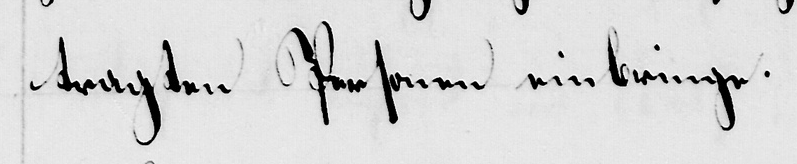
tragten Personen einbringe.
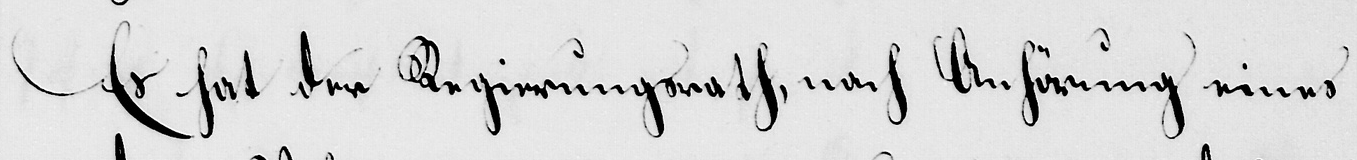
Es hat der Regierungsrath, nach Anhörung eines
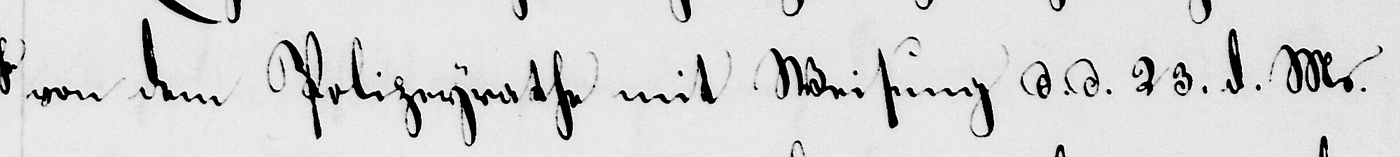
von dem Polizeyrathe mit Weisung d. d. 23. d. Ms.
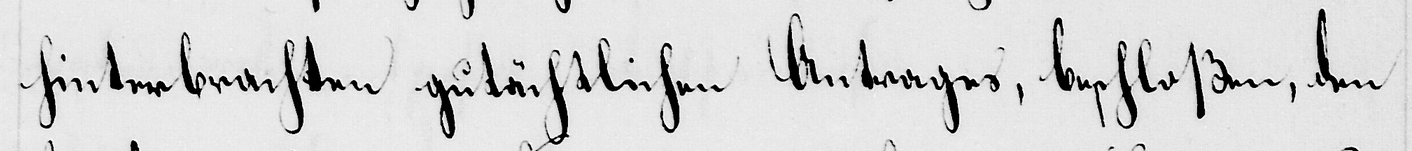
hinterbrachten gutächtlichen Antrages, beschloßen, den
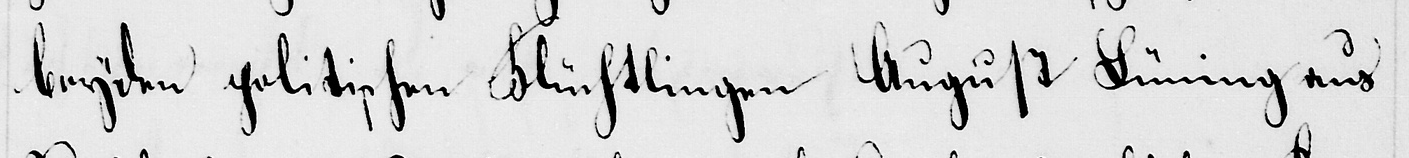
beyden politischen Flüchtlingen August Lüning aus
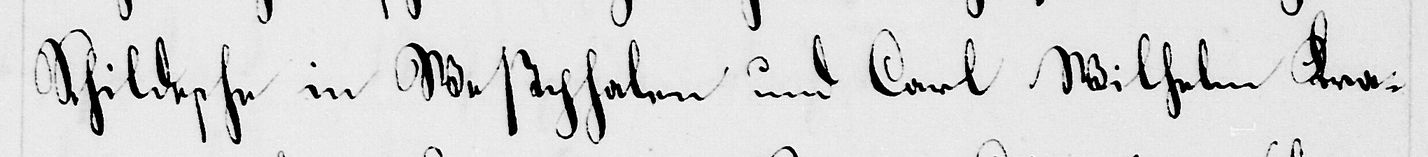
Schildesche in Westphalen und Carl Wilhelm Kra¬
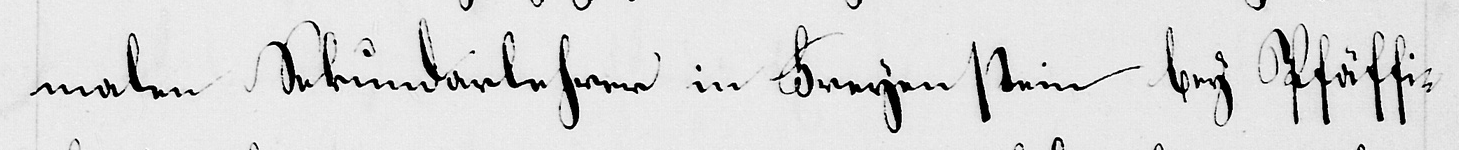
malen Sekundarlehrer in Freyenstein bey Pfäffi¬
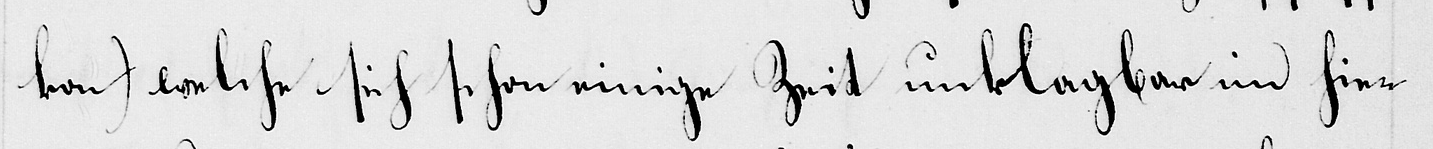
kon) welche sich schon einige Zeit unklagbar im hie¬
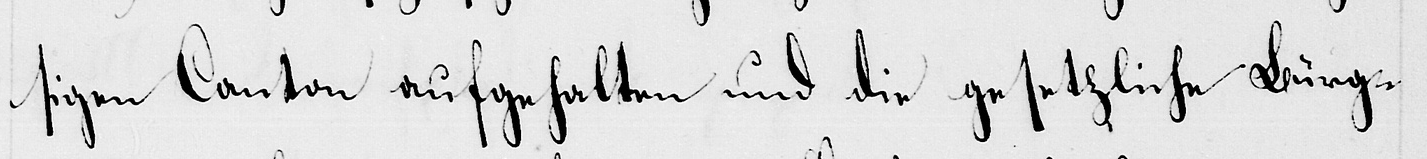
sigen Canton aufgehalten und die gesetzliche Bürg¬
